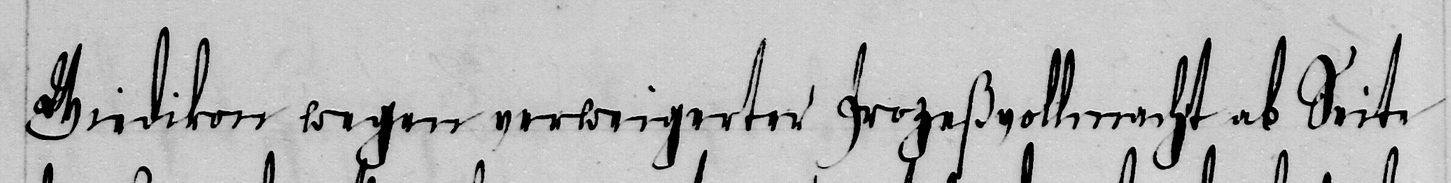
Wiedikon wegen verweigerter Prozeßvollmacht ab Seite
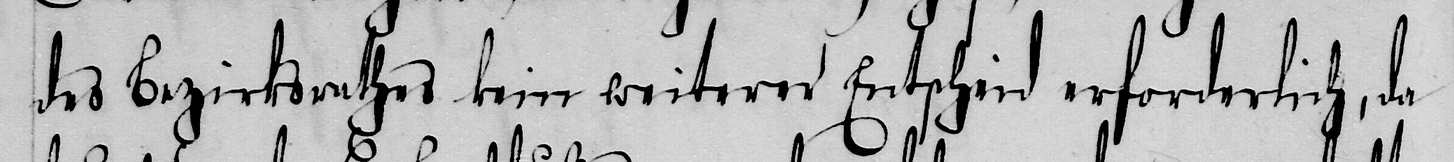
des Bezirksrathes kein weiterer Entscheid erforderlich, da
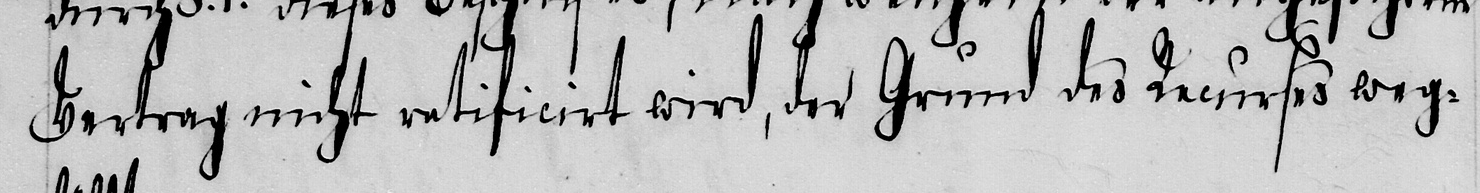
Vertrag nicht ratificirt wird, der Grund des Recurses weg¬
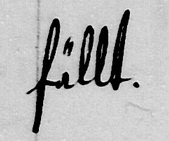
fällt.
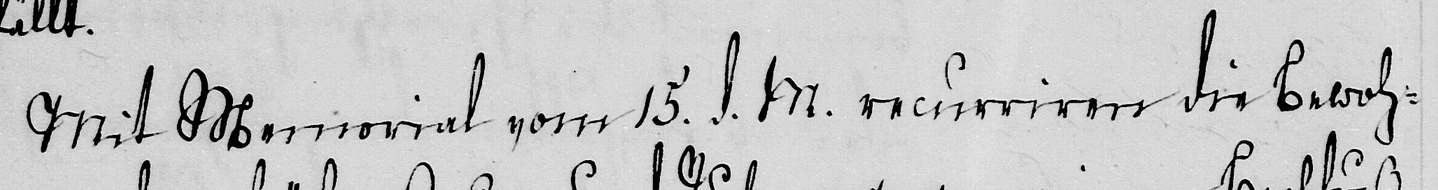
Mit Memorial vom 15. d. M. recurriren die Bewoh¬
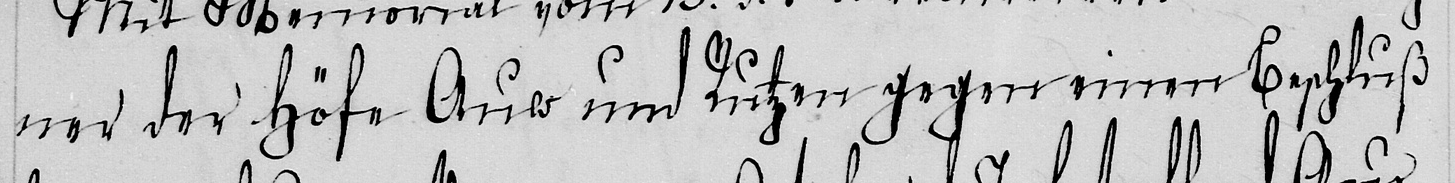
ner der Höfe Auw und Rutzen gegen einen Beschluß
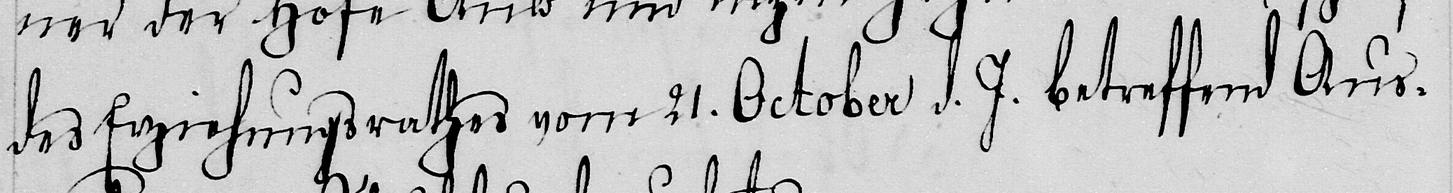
des Erziehungsrathes vom 21. October d. J. betreffend Aus¬
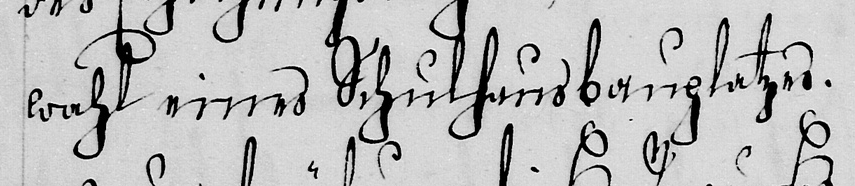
wahl eines Schulhausbauplatzes.
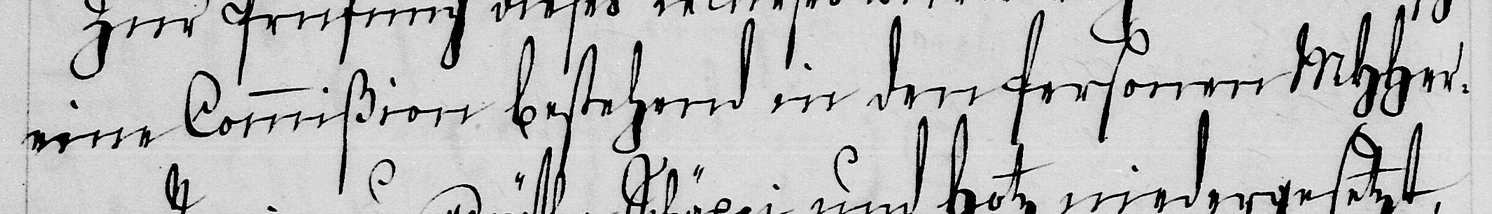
eine Commißion bestehend in den Personen MHHer¬
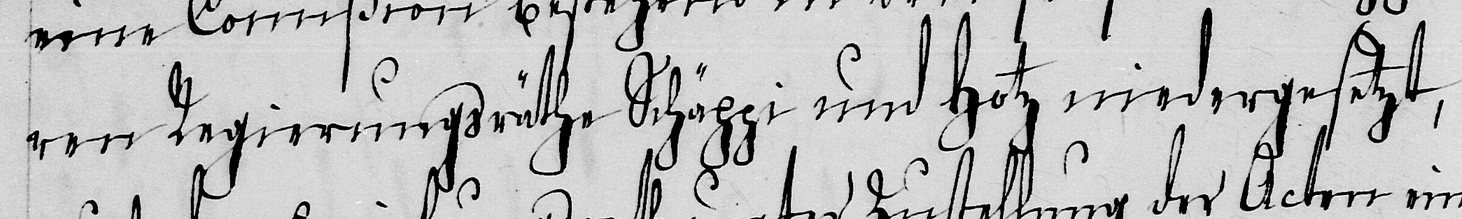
ren Regierungsräthe Schäppi und Hotz niedergesetzt,
